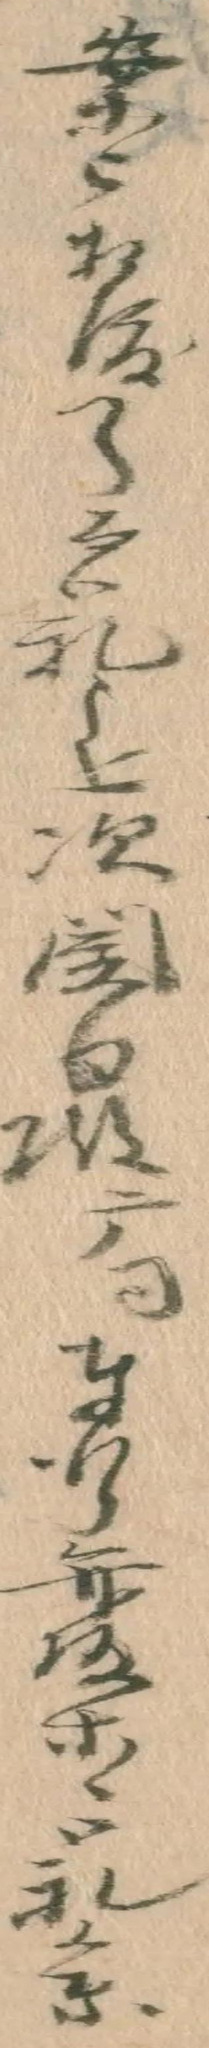案被相渡了而御礼申上次関白殿鷹司奉行弁殿等へ御礼参
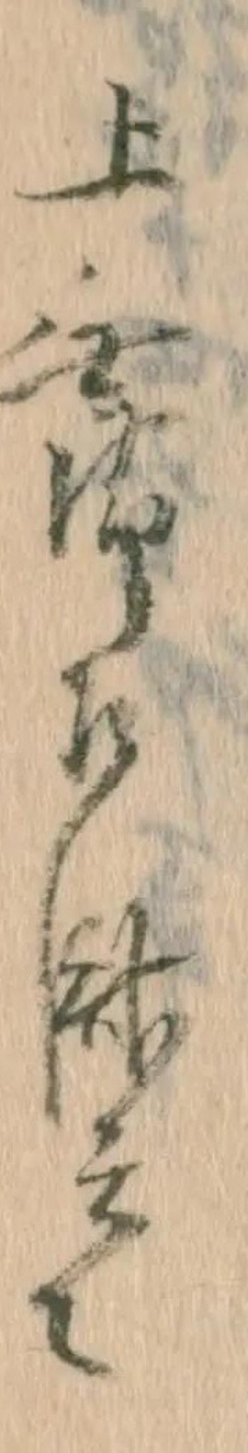上無滞相済候云々
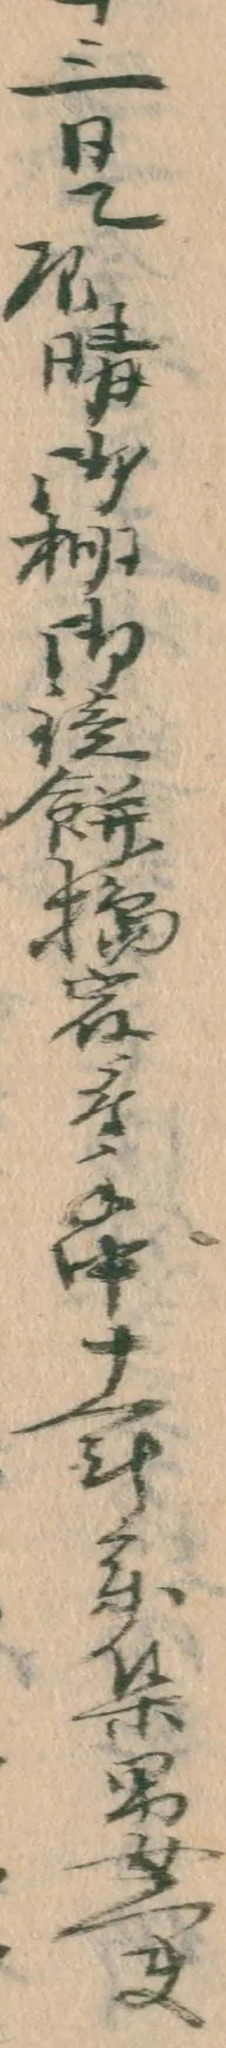十三日乙辰晴御棚御供餅搗宿ニ付手中十人斗参集男女一夫
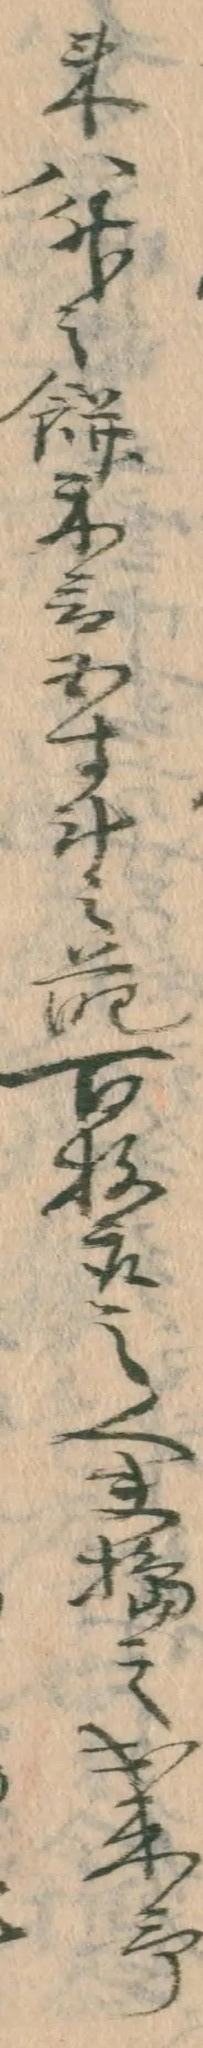来八升之餅米ニ而五寸斗之葩百枚取之人夫搗之出来予
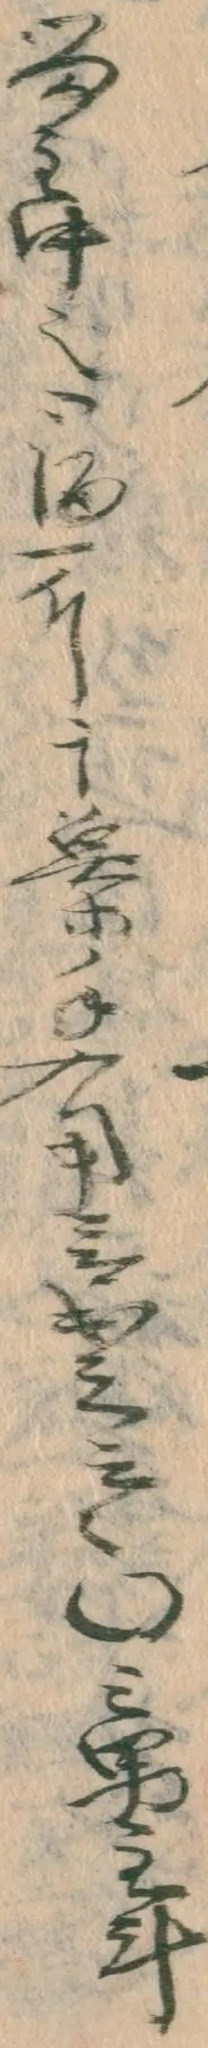留主中之御酒一升干魚等手入用ニ而出之云々○三男主斗
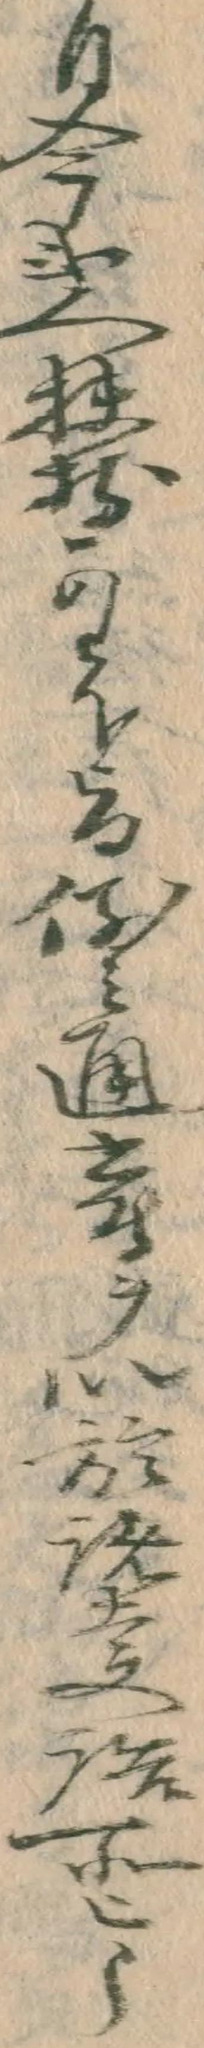自今弐人扶持可被下旨例之通書付ヲ以於諸大夫詰所被申
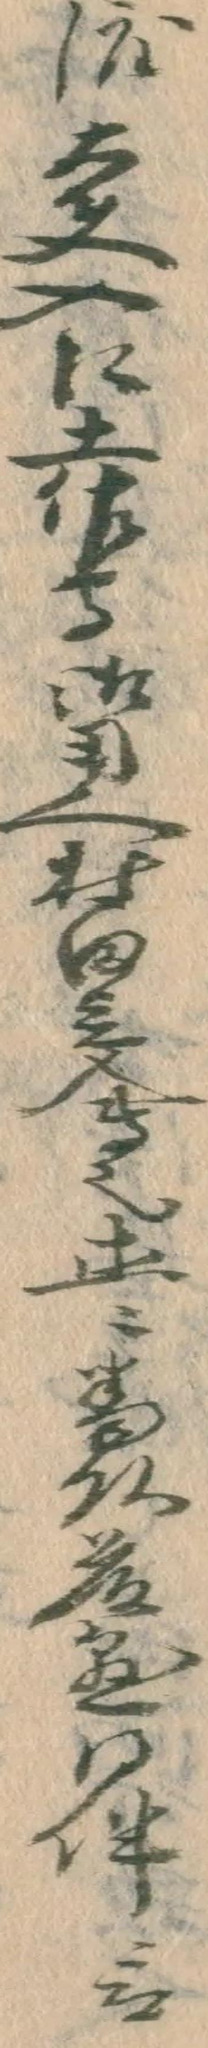渡大夫入江土佐守御用人村田立會也直ニ番頭藤懸同伴ニ而
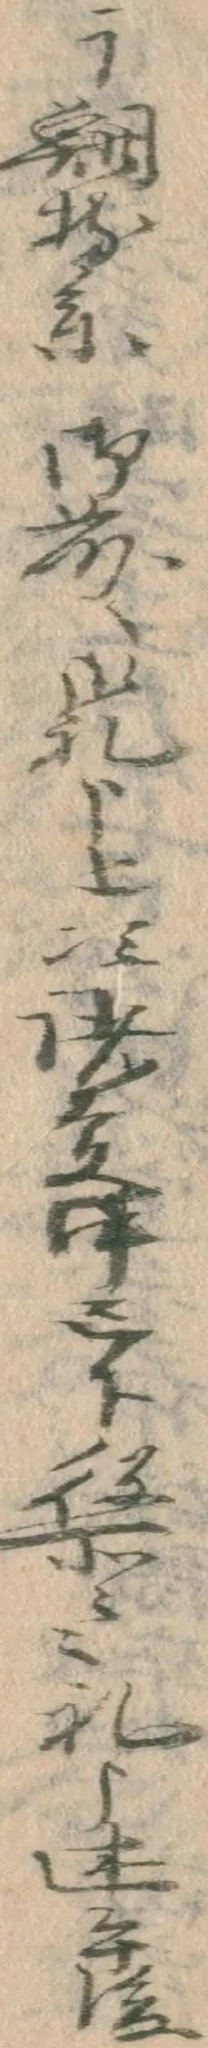干鯛持参御前へ御礼申上次諸大夫已下役所々々礼申述午後
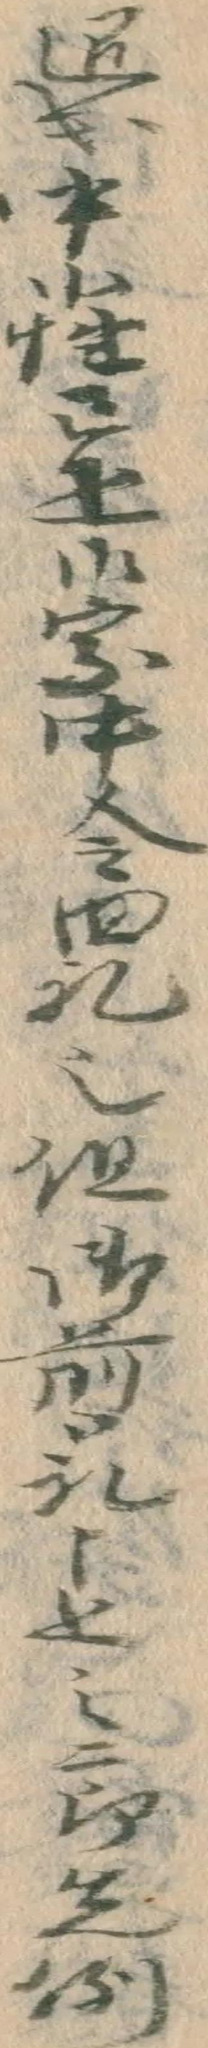退出中小性已上御家中令回礼也但御前御礼申上之節先例
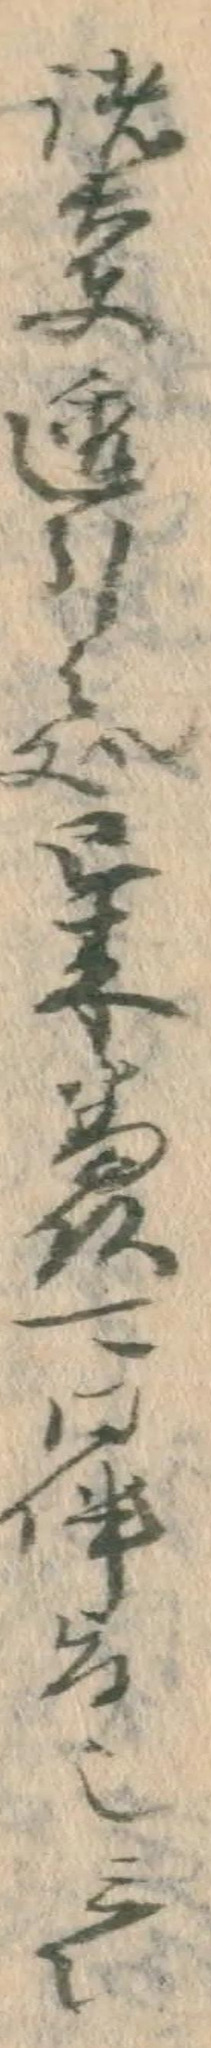諸大夫透引之処已来番頭可同伴旨也云々
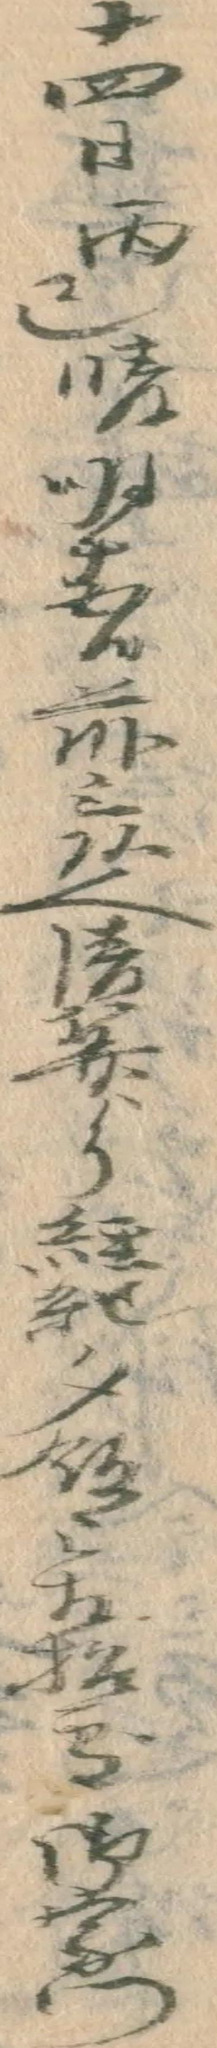十四日丙巳晴明十五日前三頭人清算より経紀夕飯被相招處御家門
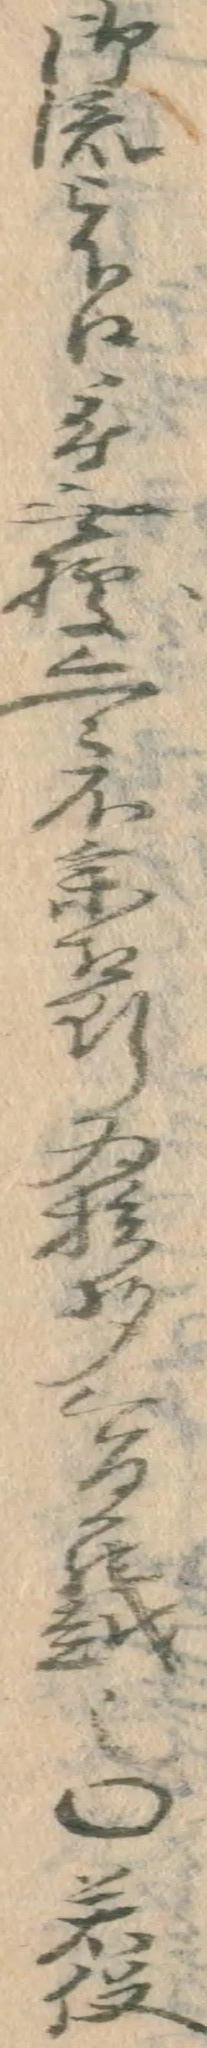御添被下候ニ付無拠不参相断為挨拶今日罷越也○若役
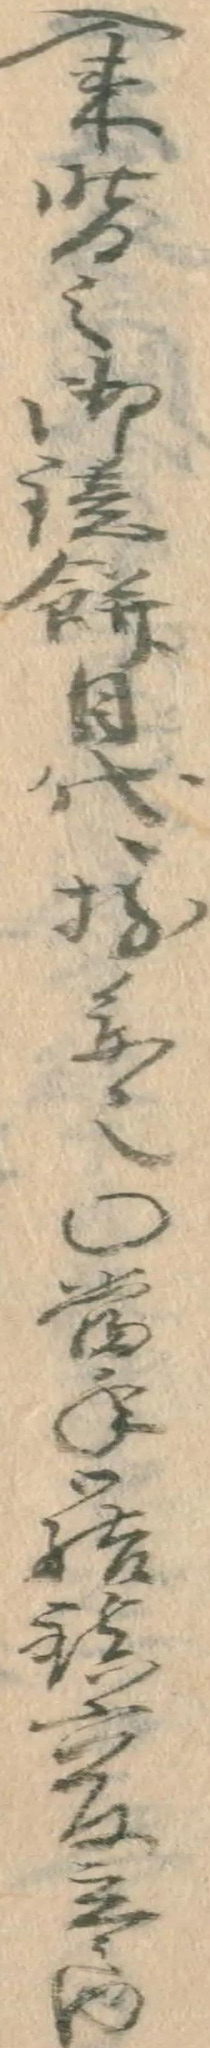入来昨日之御読餅目代へ持参也○當年御結鎮六反立之内
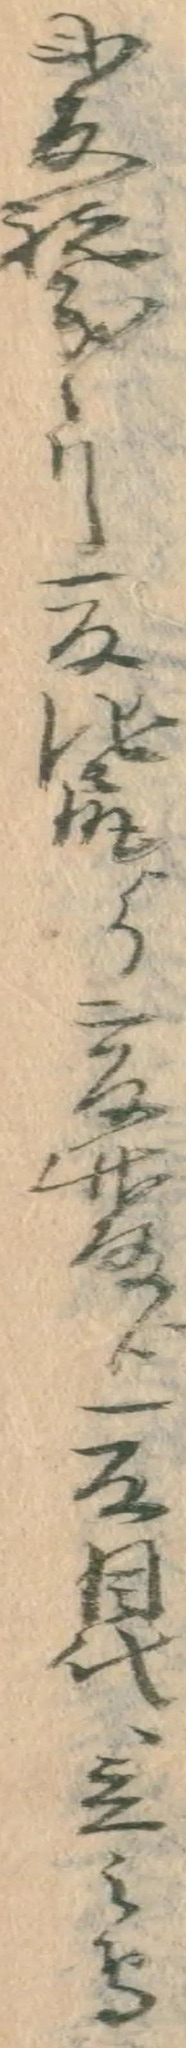弐反祝義之引一反池尻より一反弁殿え一反目代へ立之處

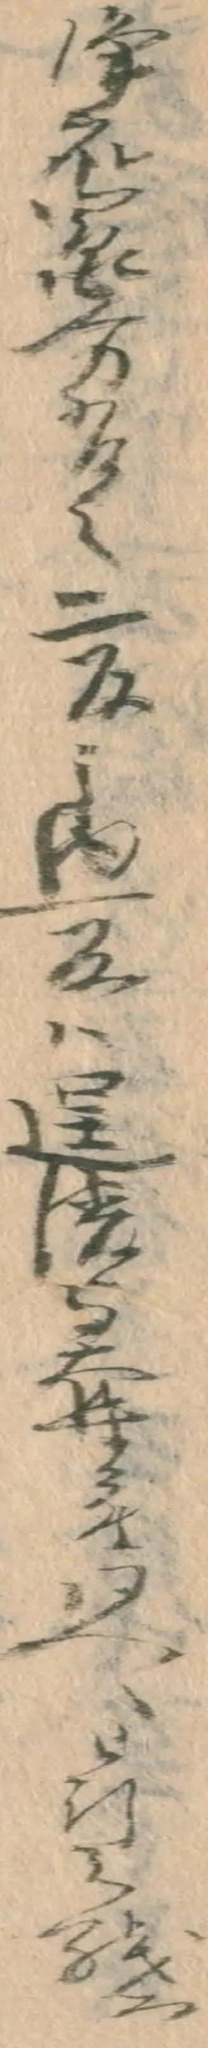浄衣鬮分有之二反之内一反ハ逞清と大井ニ付同人へ被引之残而
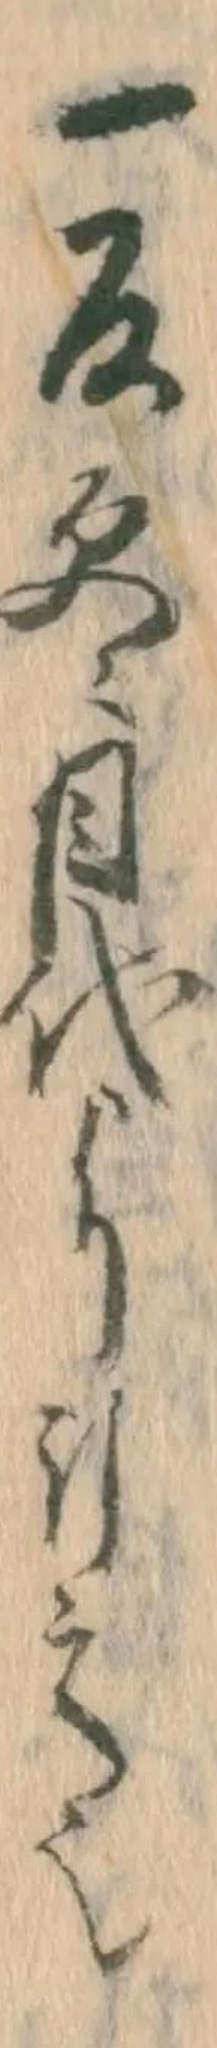一反更ニ目代より引之也
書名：賀茂社記録. 第69冊
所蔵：国立国会図書館 National Diet Library, JAPAN
